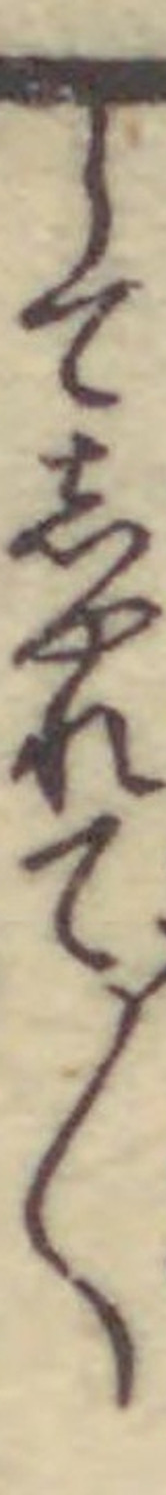してしやれて〳〵
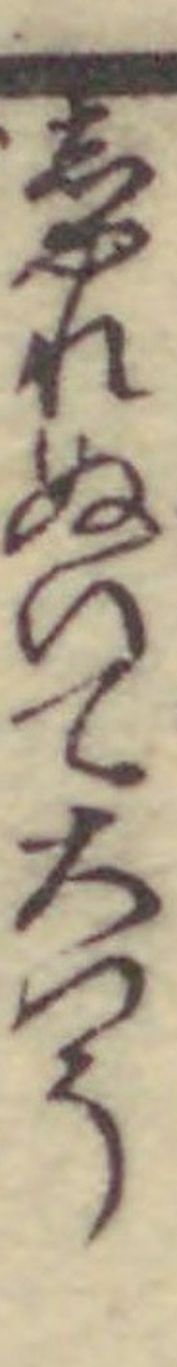しやれぬいて大つう
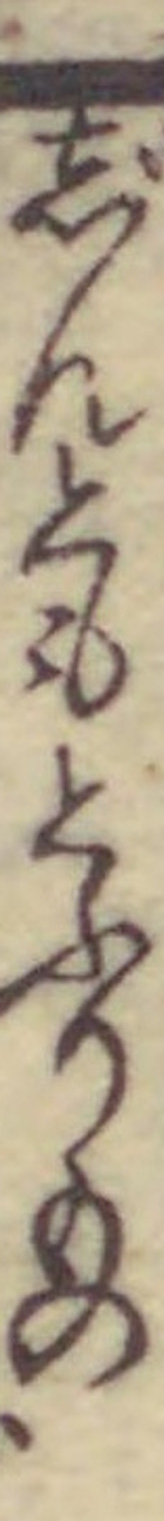じんともとふりもの
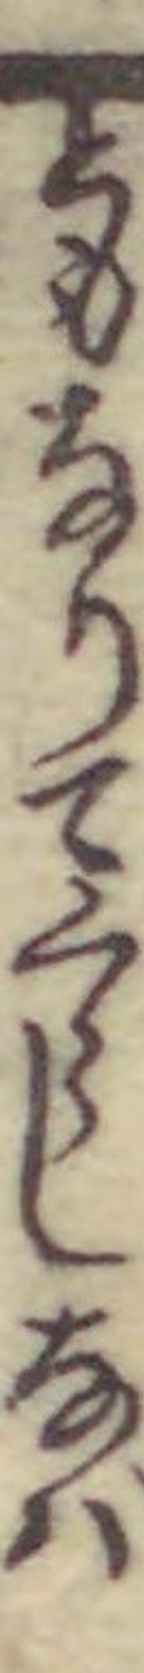ともなりてくらしなば
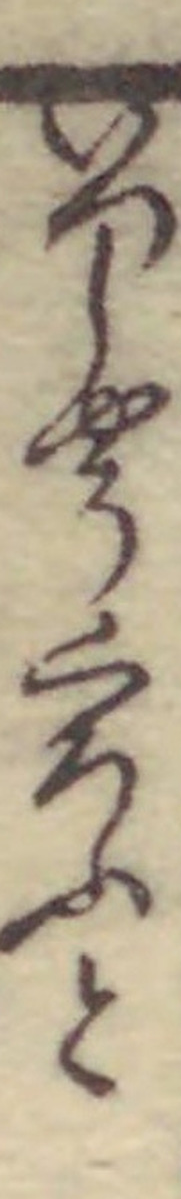いつしやうくろふと
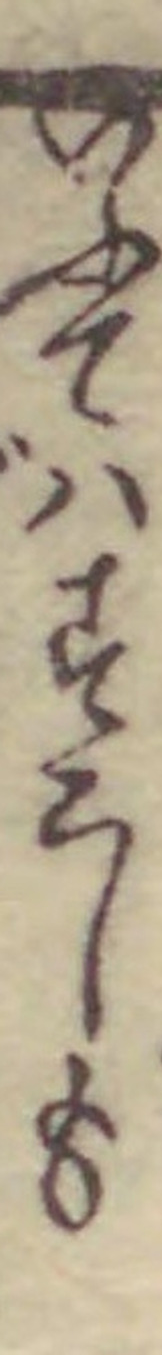いふてはすこしも
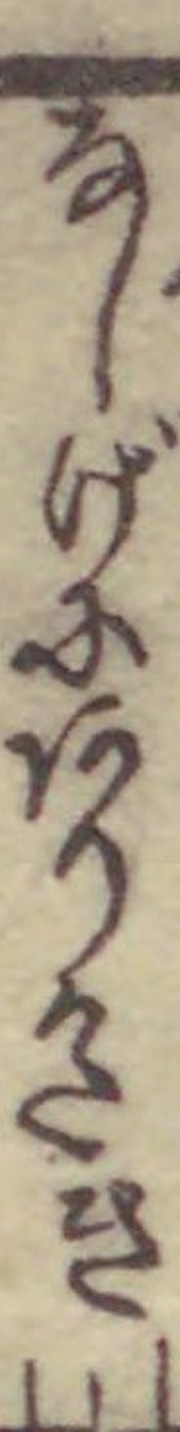なしげにありかたき
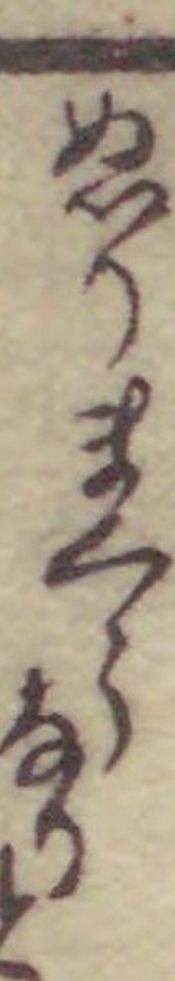ぬりまくらなりと
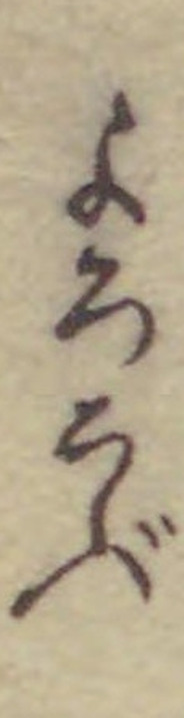よろこぶ

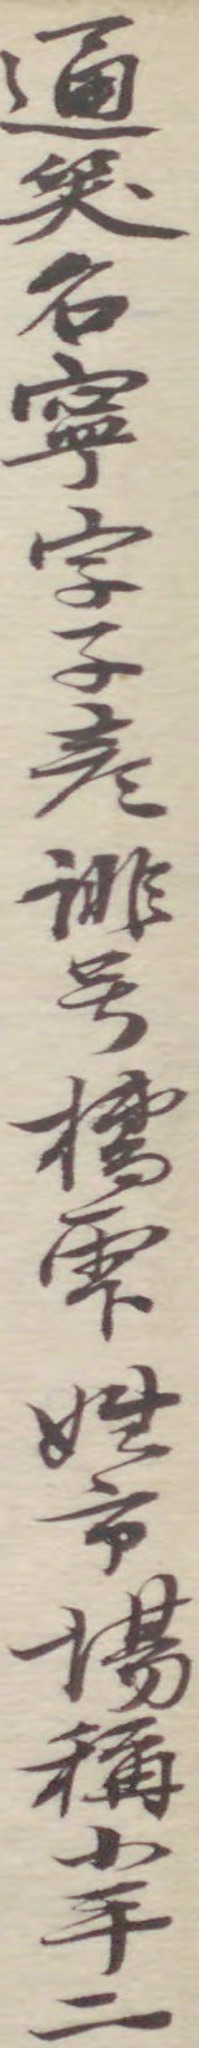通笑名寧字子彦誹号橘雫姓市場称小平二
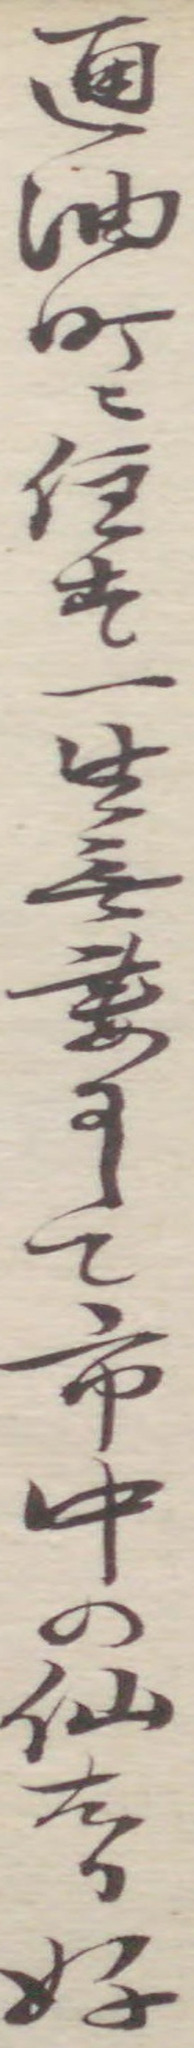通油町に住す一生無妻にして市中の仙たり好
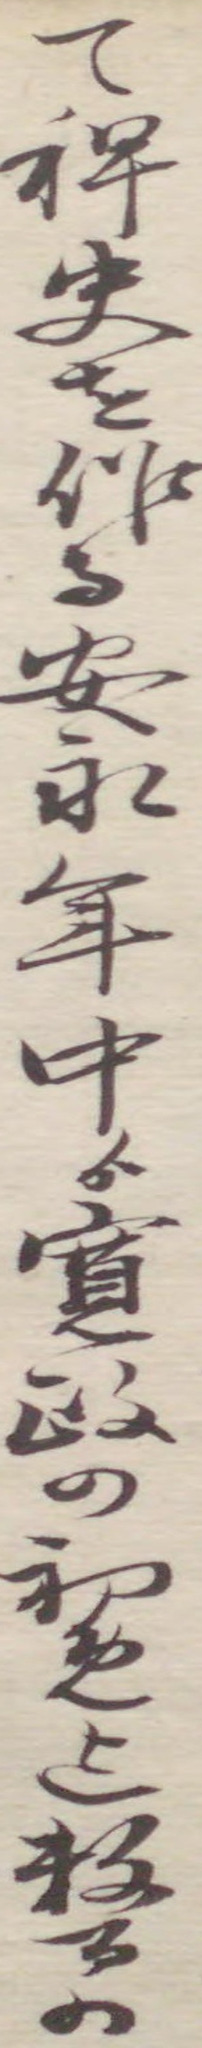て稗史を作る安永年中ゟ寛政の初め迄数百の
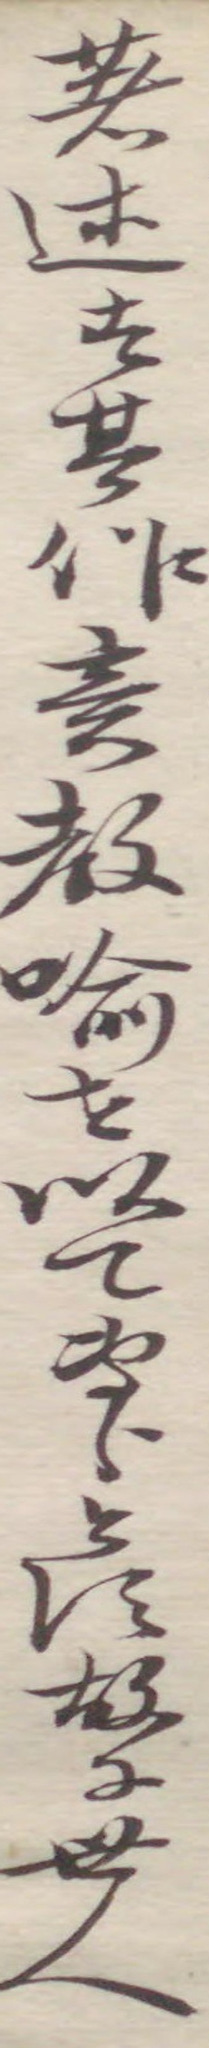著述す其作壱教喩を以て専らとす故に世人
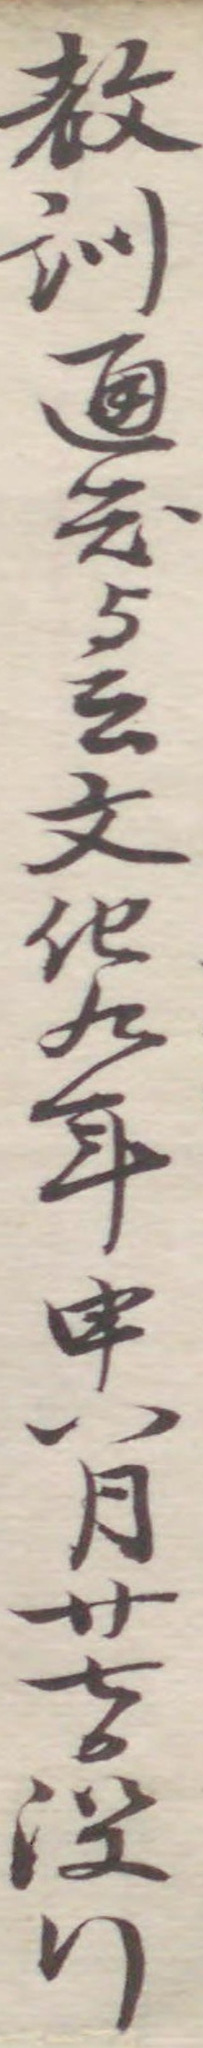教訓通笑と云文化九年申八月廿七日没行
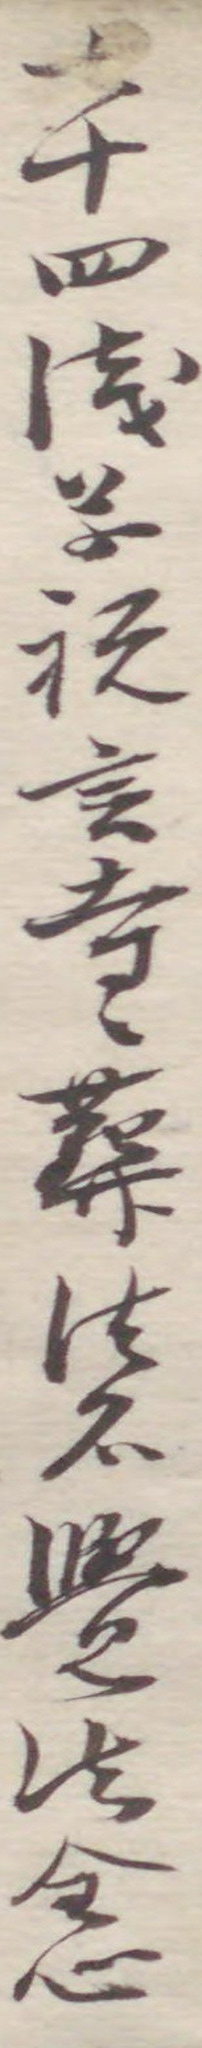七十四浅草祝言寺ニ葬法名覚法全心
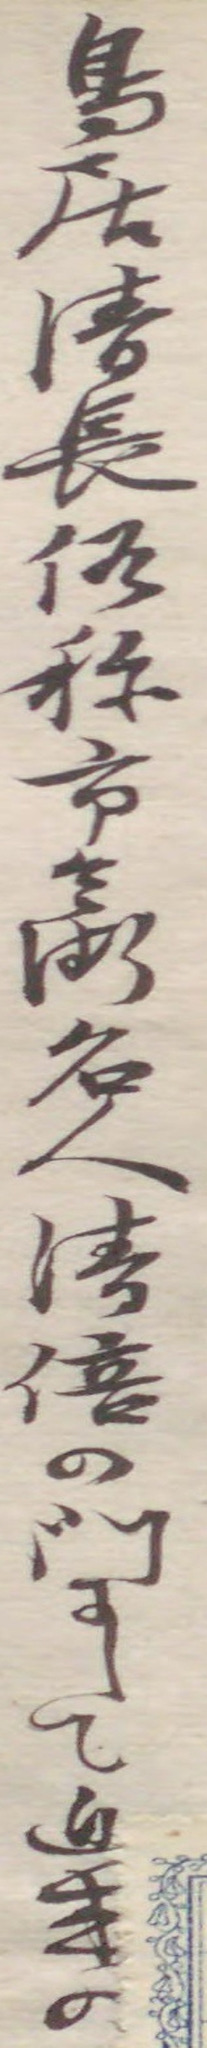鳥居清長俗称市兵衛名人鳥居清倍の門にして近来の
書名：大通人穴[サガシ] 3巻
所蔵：国立国会図書館 National Diet Library, JAPAN
